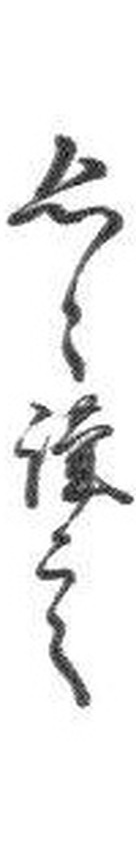恐々謹言
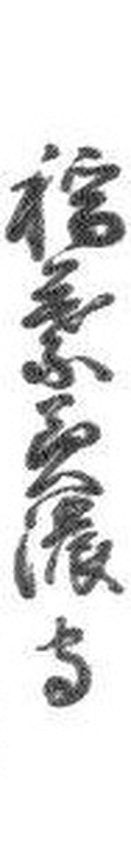稲葉美濃守
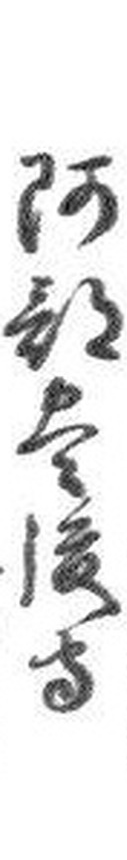阿部豊後守
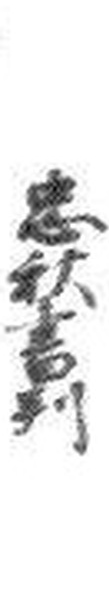忠秋書判
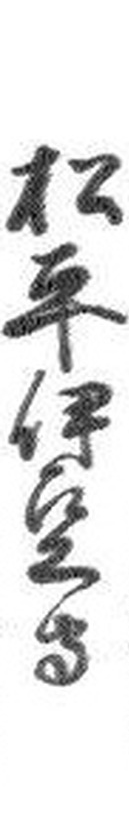松平伊豆守
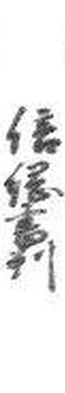信綱書判
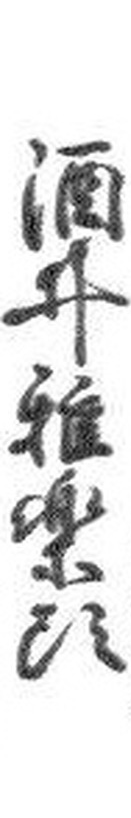酒井雅樂頭
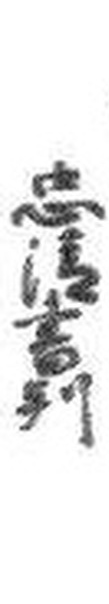忠清書判
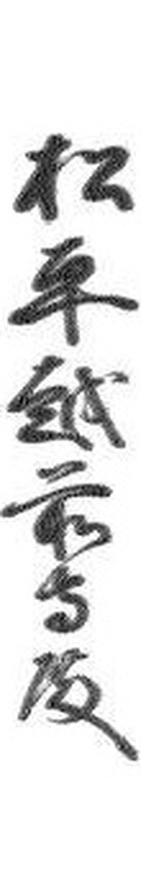松平越前守殿
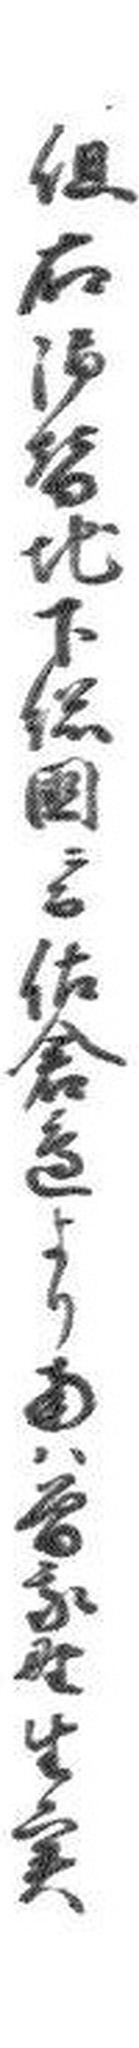但右御替地下総国ニ而佐倉辺より南は曽我野生実

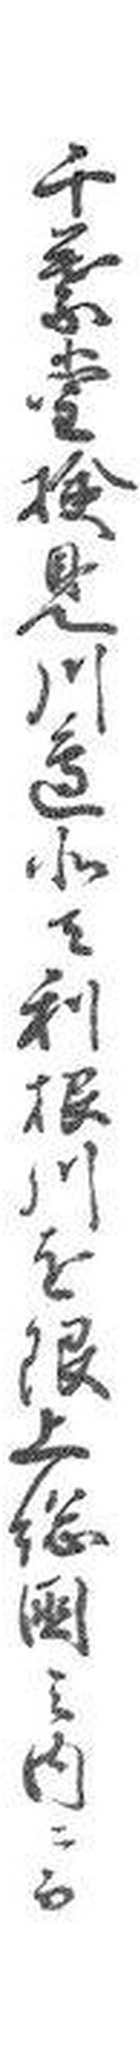千葉堂検見川辺北は利根川を限上総国之内ニ而
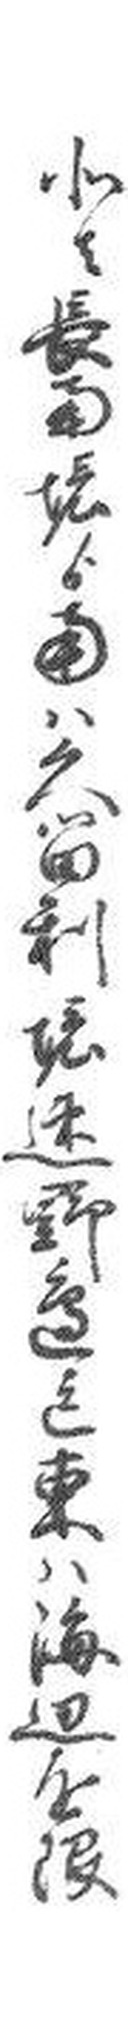北は長南境ゟ南は久留利境速野辺迄東は海辺を限
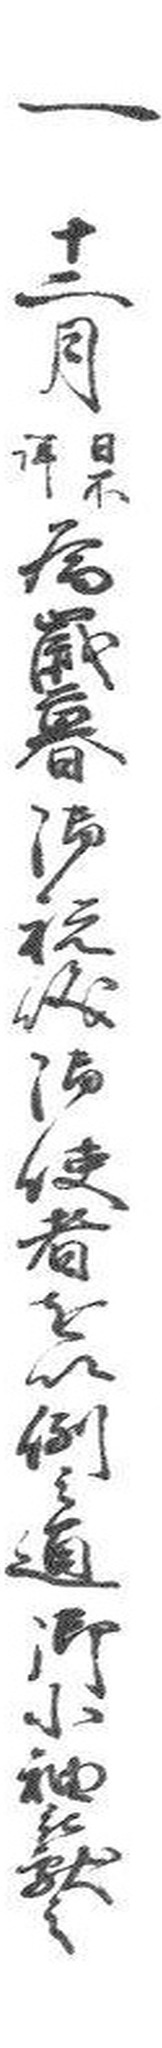一十二月日不詳為歳暮御祝儀御使者を以例之通御小袖被献之
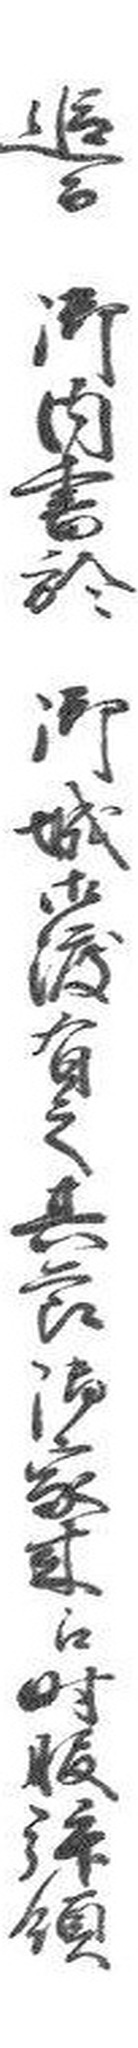追而御内書於御城御渡有之其節御家来江時服拝領
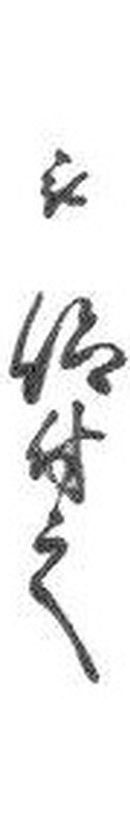被仰付之
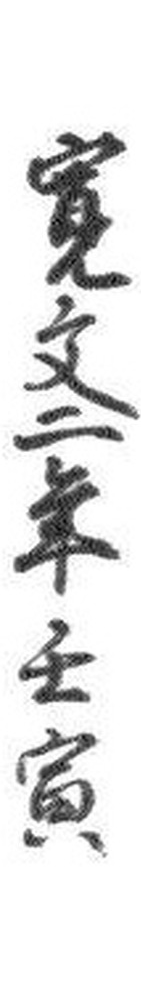寛文二年壬寅
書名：家譜 六 光通公 従万治三年到寛文三年
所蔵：福井県文書館 Fukui Prefectural Archives
